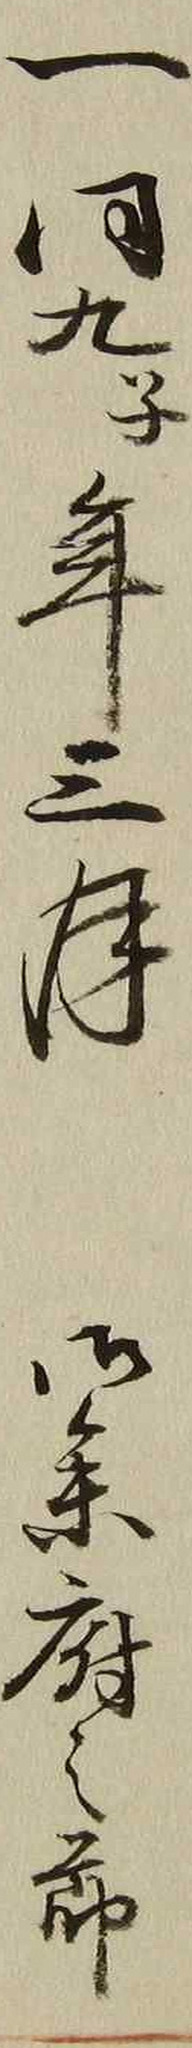一同九子年三月御参府之節
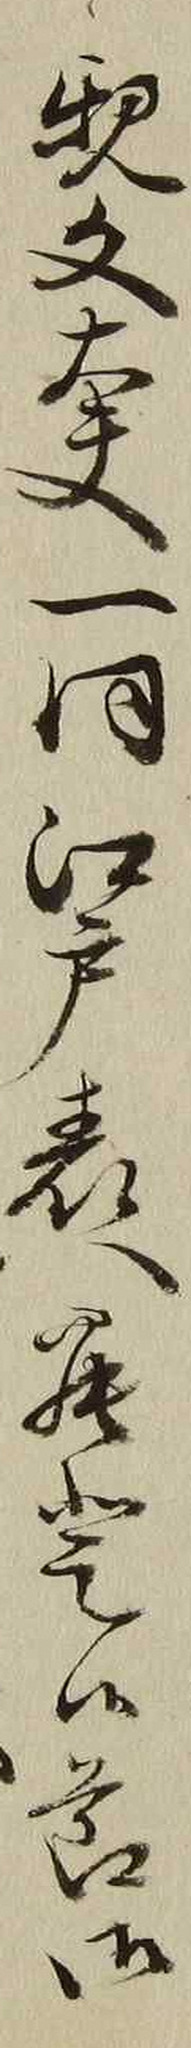親久大夫一同江戸表へ罷登候節御
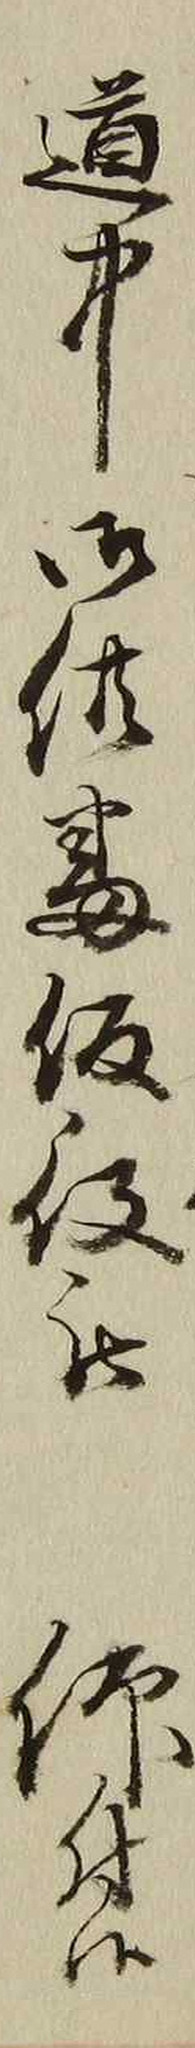道中御供番仮役被仰付候
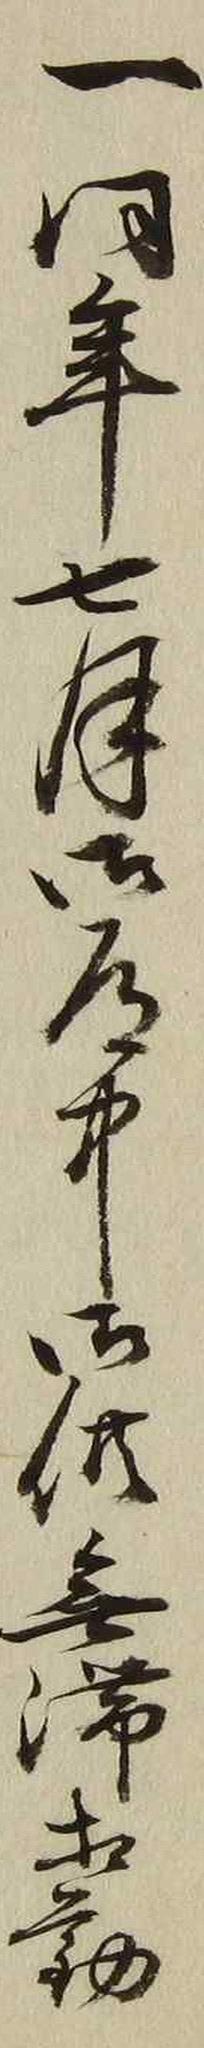一同年七月御道中御供無滞相勤
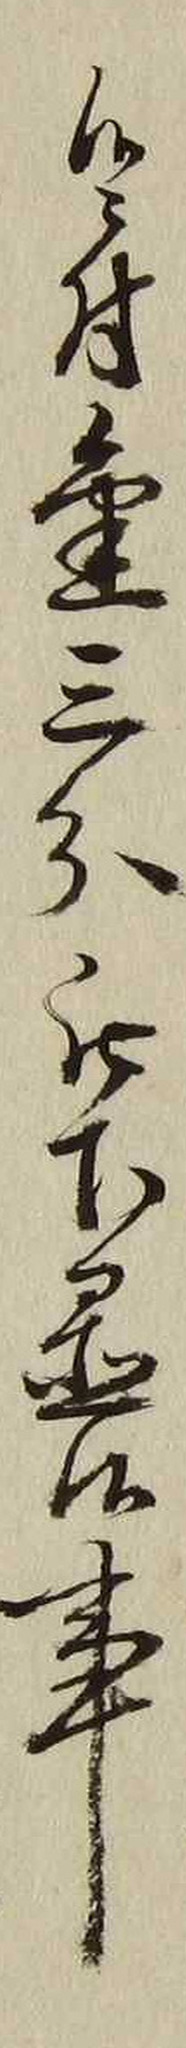候ニ付金三分被下置候事
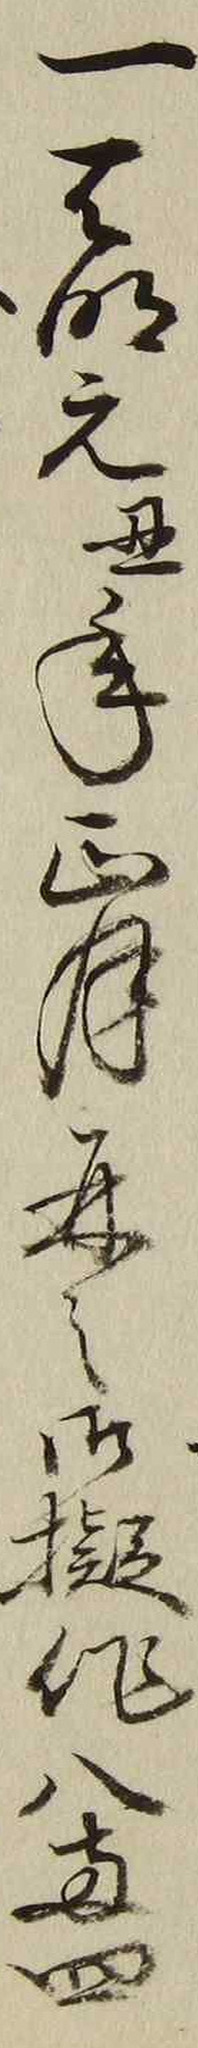一天明元丑年正月再之御擬作八両四
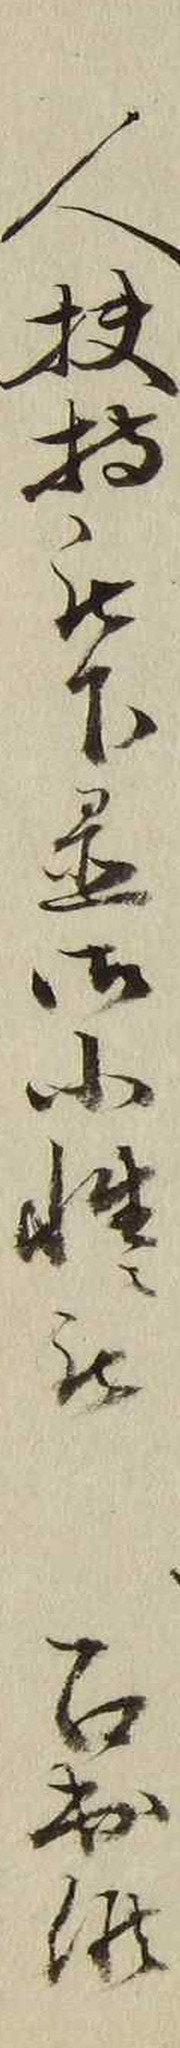人扶持被下置御小性ニ被召出候

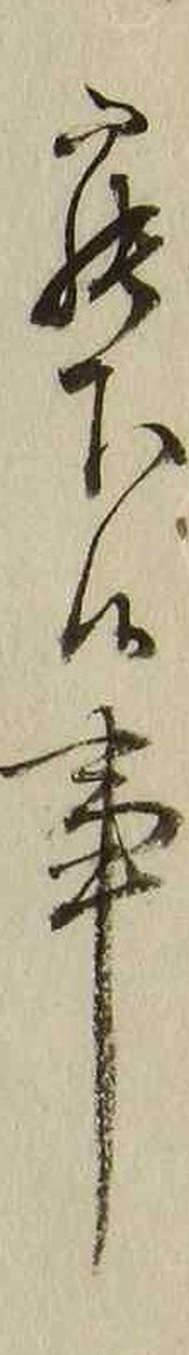罷下候事
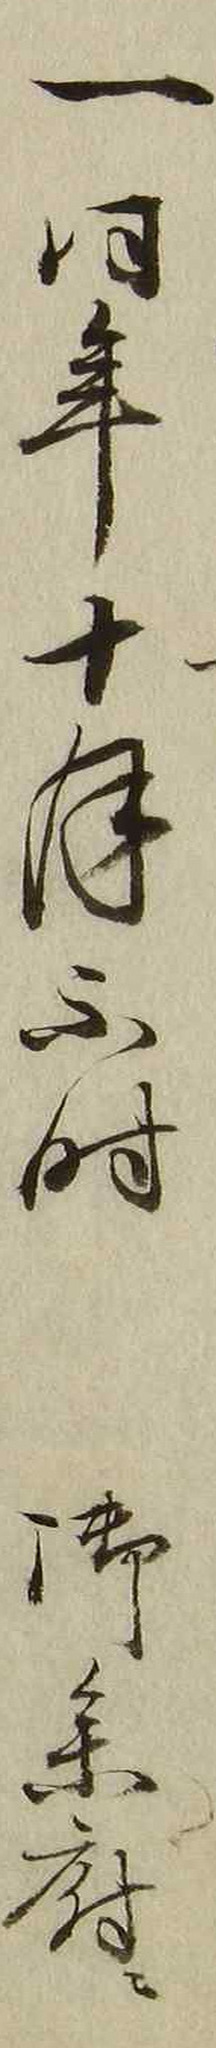一同年十月不時御参府ニ
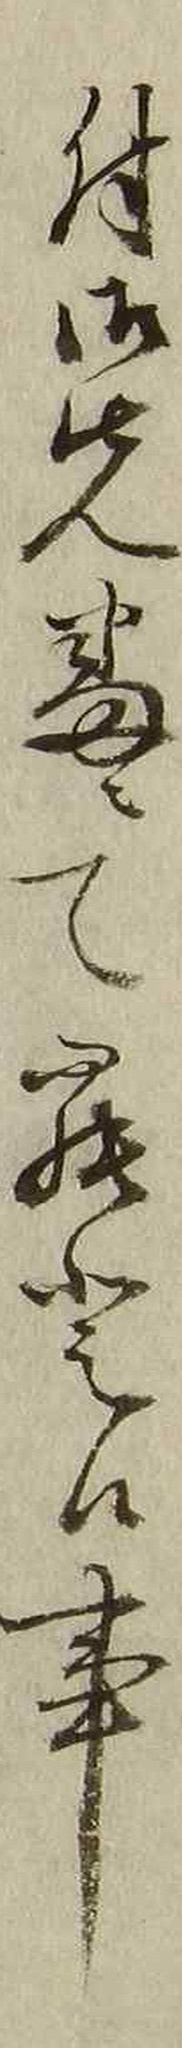付御先番ニて罷登候事
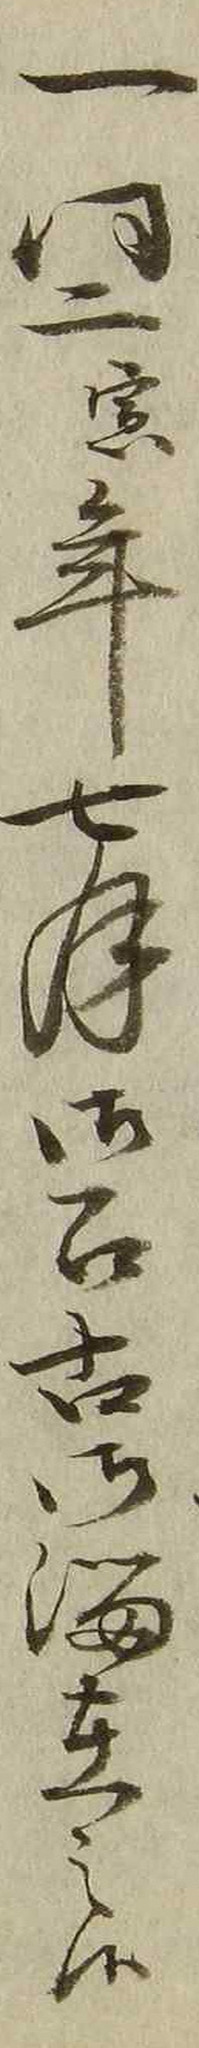一同二寅年七月御召古御溜在之候
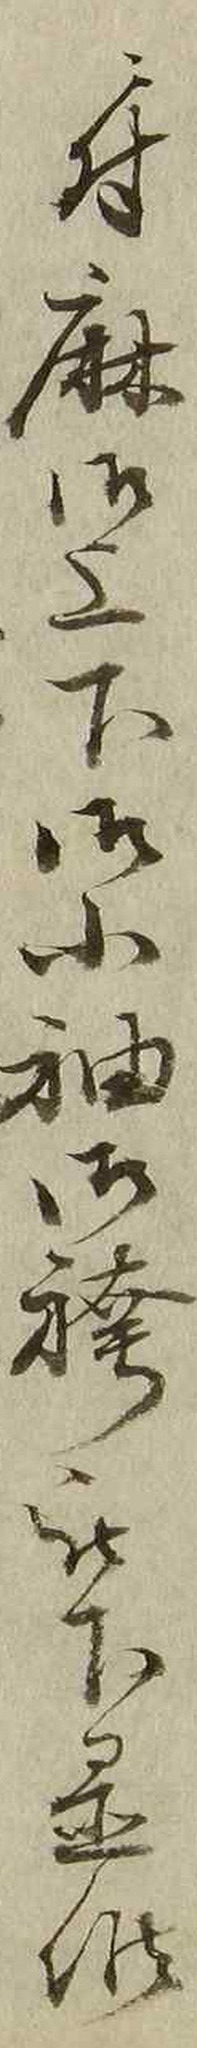ニ付麻御上下御小袖御袴被下置候
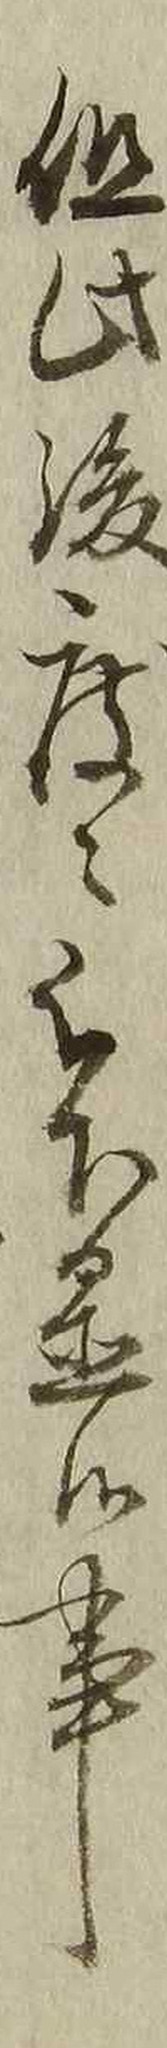但此後度々被下置候事
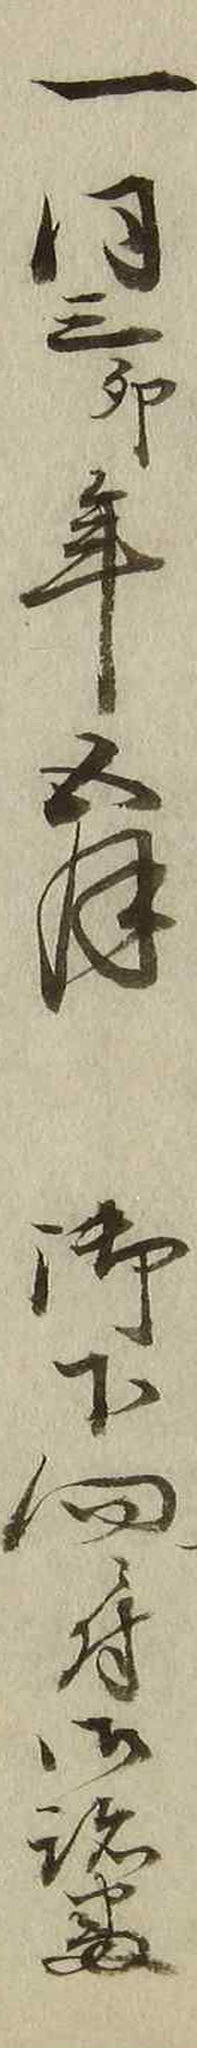一同三卯年五月御下向ニ付御跡番
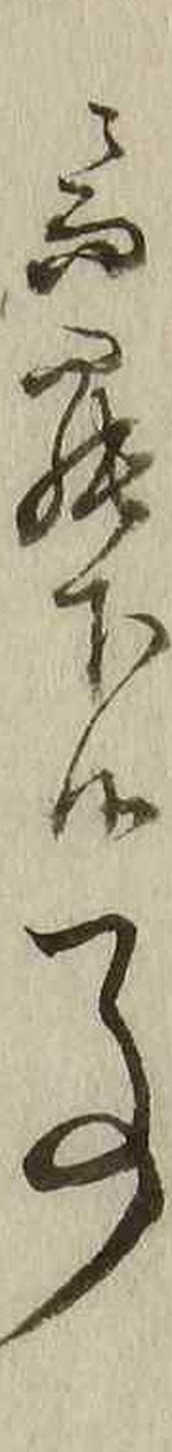ニ而罷下候事
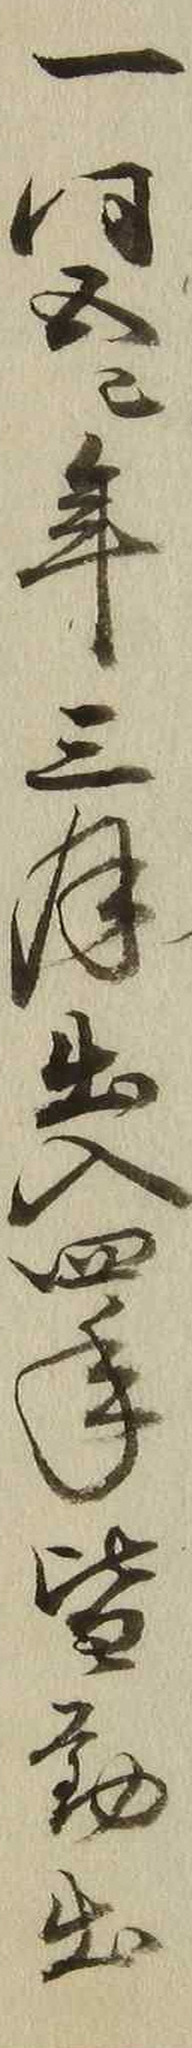一同五巳年三月出入四年皆勤出
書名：諸士系譜　巻之36　は之部4
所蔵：会津若松市立会津図書館
